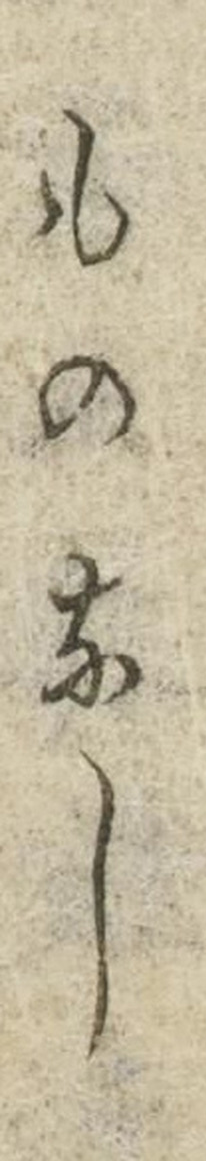ものなし
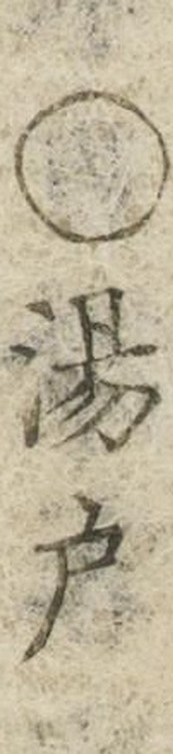○湯戸
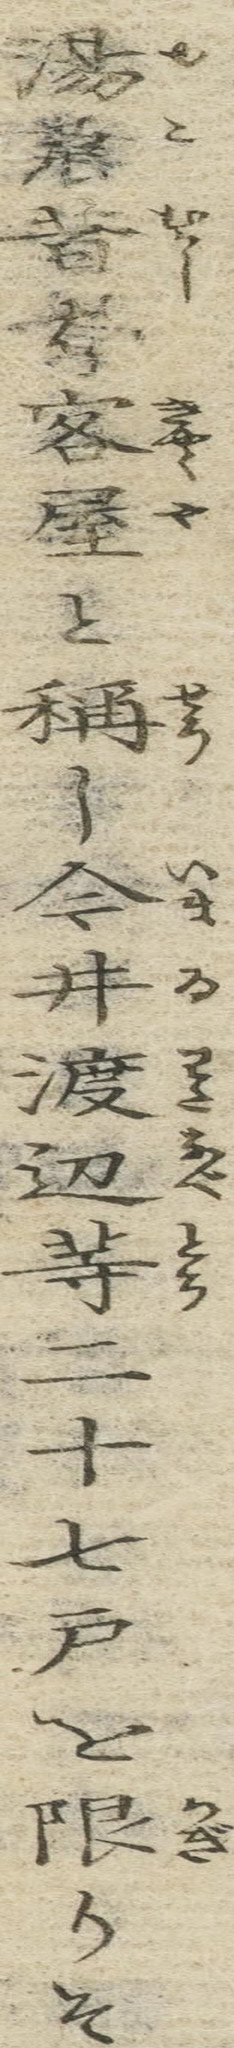湯戸昔は客屋と称し今井渡辺等二十七戸を限りそ

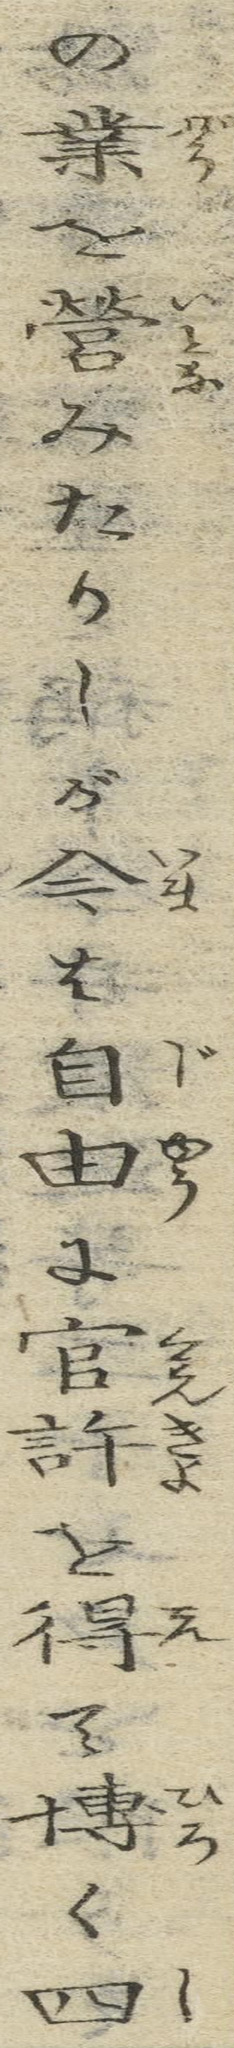の業を営みたりしが今は自由に官許を得て博く四
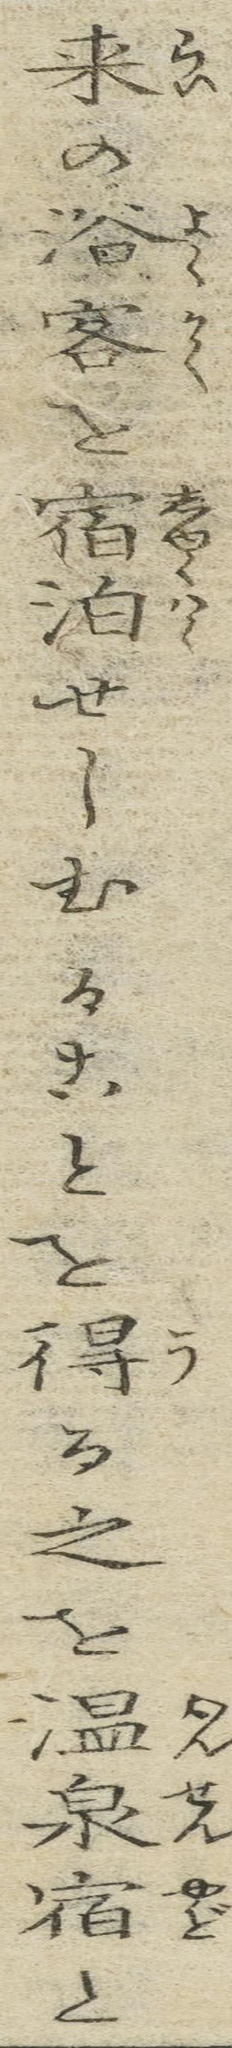来の浴客を宿泊せしむることを得る之を温泉宿と
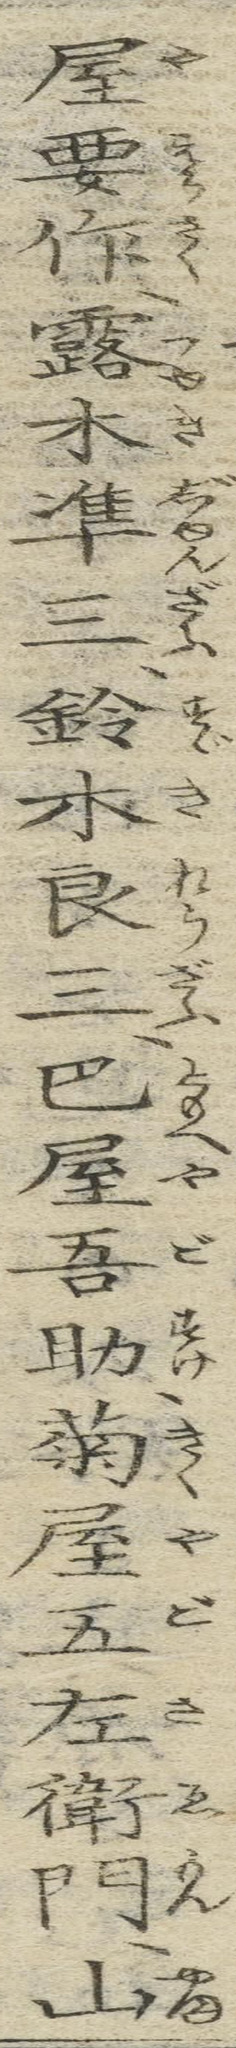屋要作、露木準三、鈴木良三、巴屋吾助、菊屋五左衛門、山
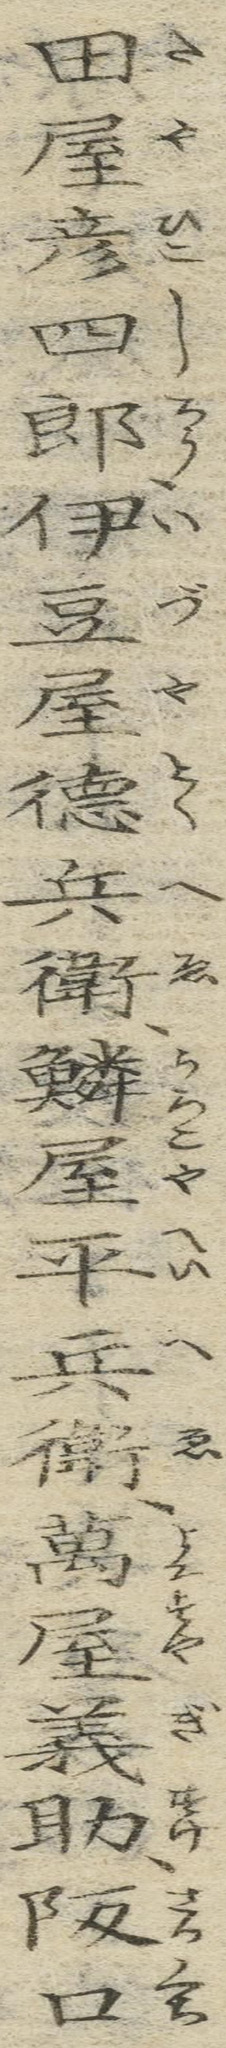田屋彦四郎、伊豆屋徳兵衛、鱗屋平兵衛、万屋義助、阪口
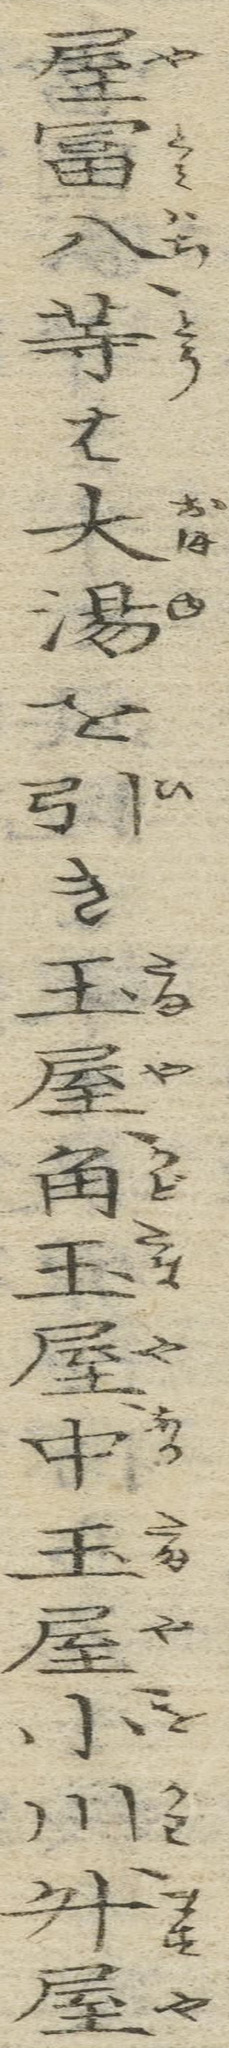屋富八、等は大湯を引き玉屋、角玉屋、中玉屋、小川、升屋
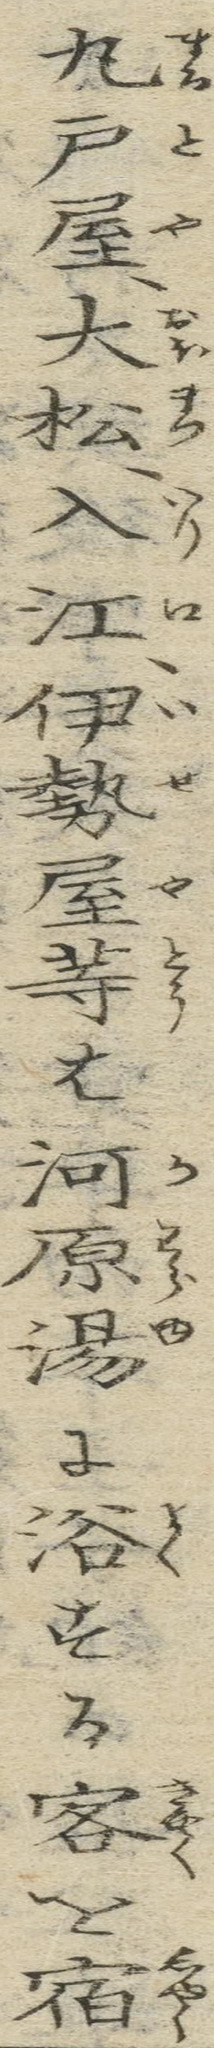丸戸屋、大松、入江、伊勢屋等は河原湯に浴する客を宿
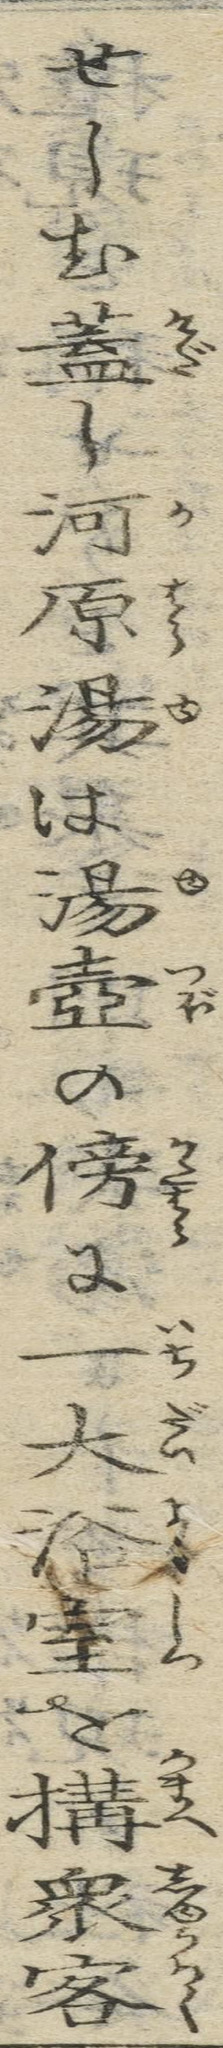せしむ蓋し河原湯は湯壷の傍に一大浴室を構衆客
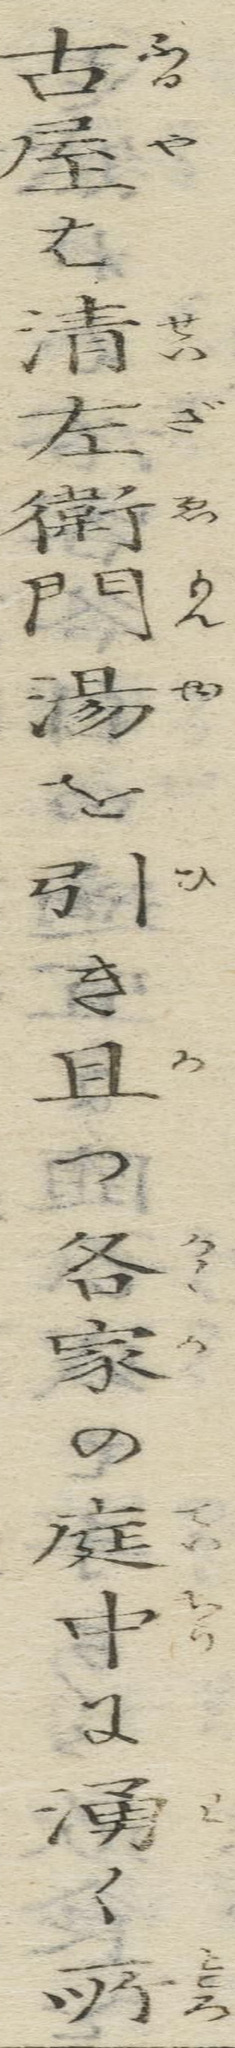古屋は清左衛門湯を引き且つ各家の庭中に湧く所
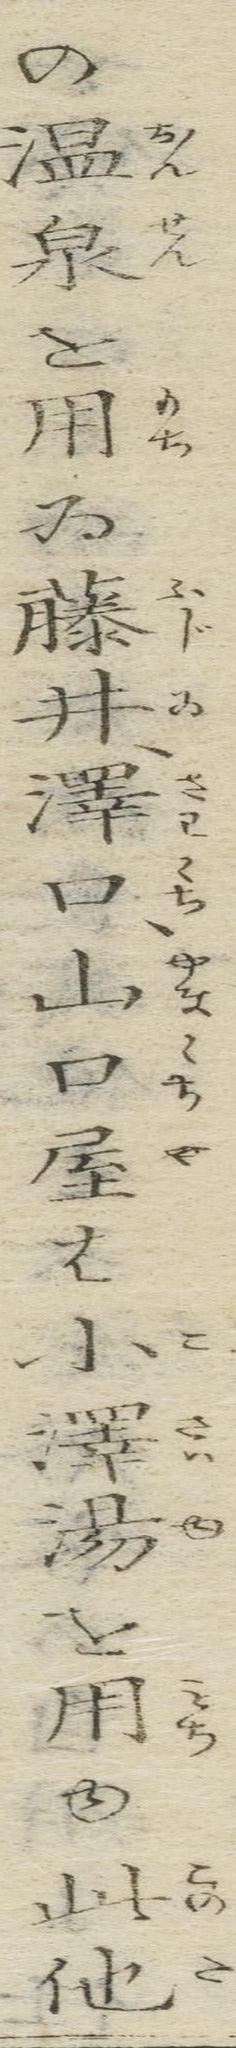の温泉を用ゐ藤井、沢口、山口屋は小沢湯を用ゆ此他
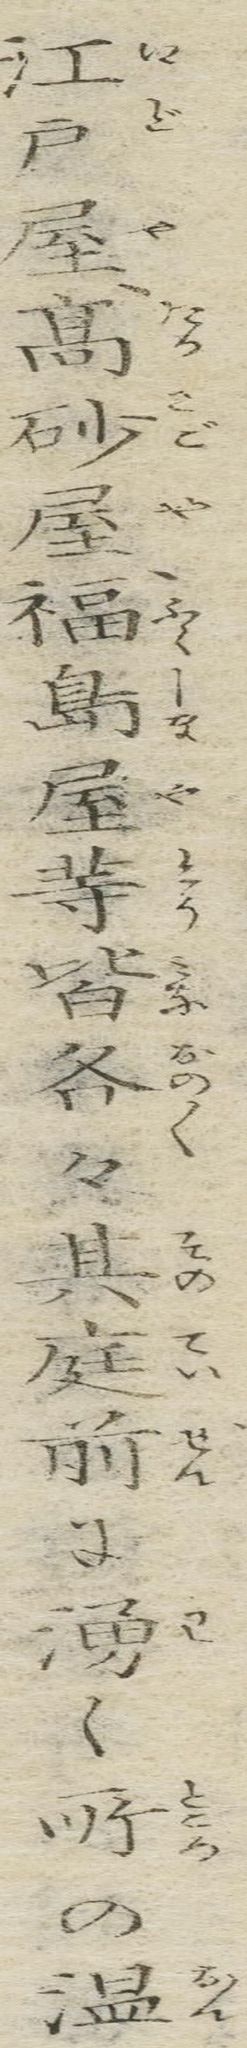江戸屋、高砂屋、福島屋等皆各々其庭前に湧く所の温
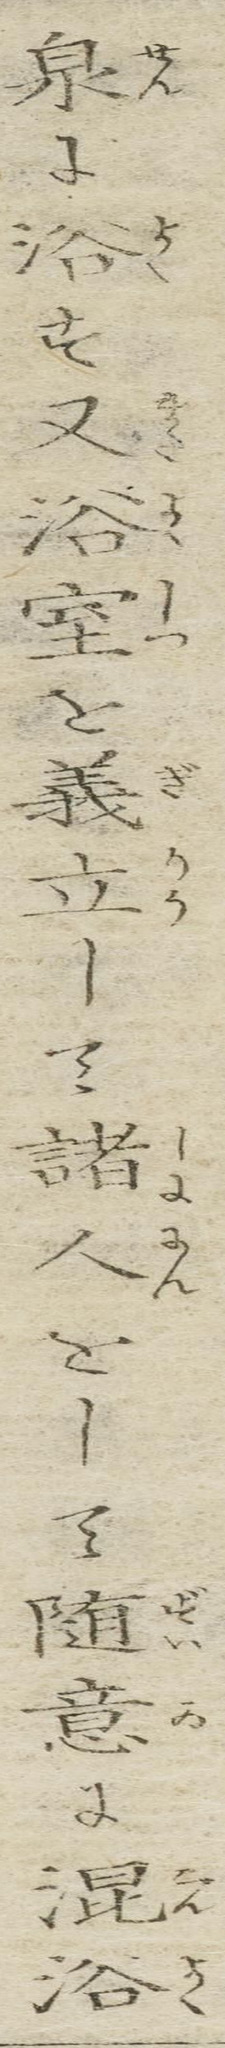泉に浴す又浴室を義立して諸人をして随意に混浴
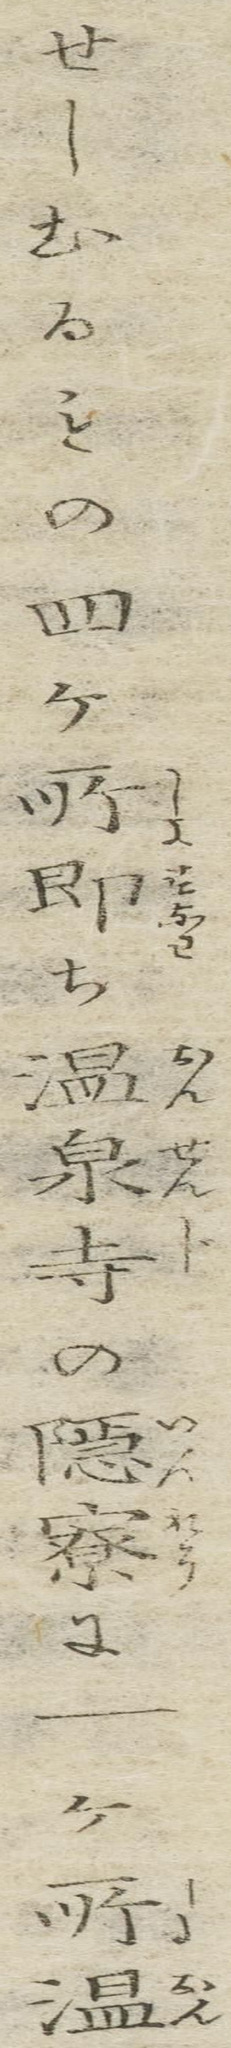せしむるもの四ヶ所即ち温泉寺の隠寮に一ヶ所温
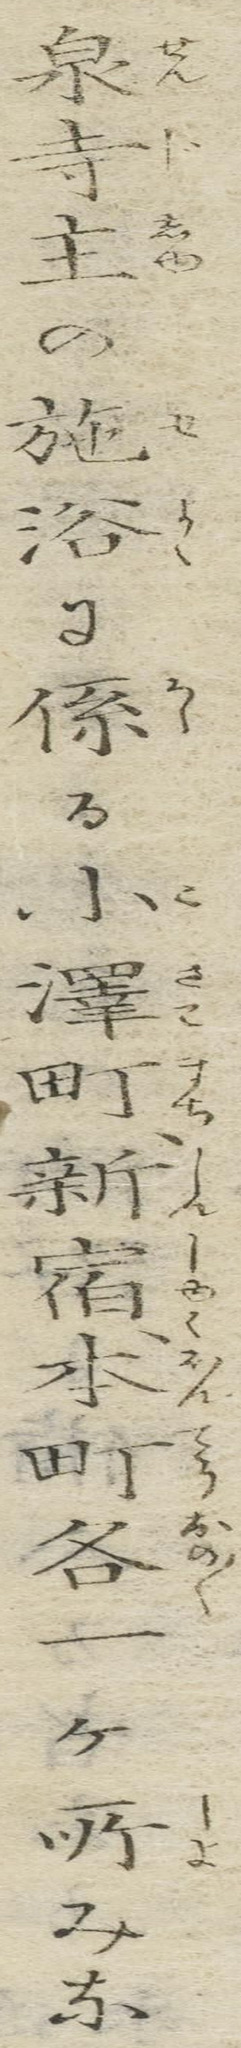泉寺主の施浴に係る小沢町、新宿、本町各一ヶ所みな
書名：豆州熱海誌　完
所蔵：東京大学地震研究所図書室 Earthquake Research Institute Library, The University of Tokyo, JAPAN
